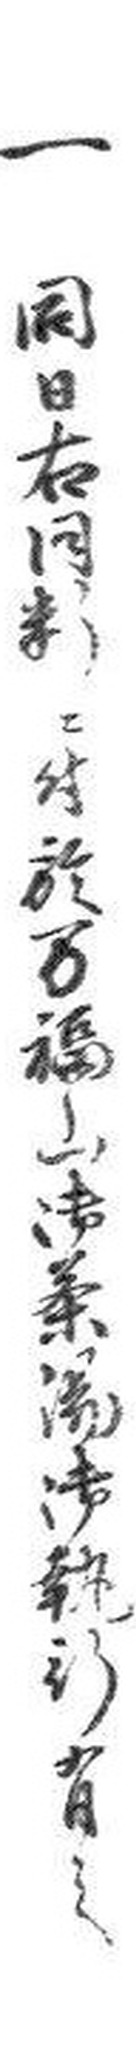一同日右同断ニ付於万福山御茶湯御執行有之
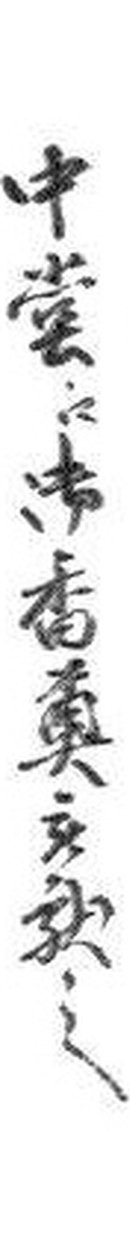中堂江御香奠被献之
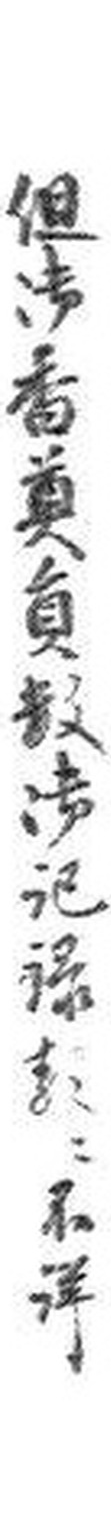但御香奠員数御記録類ニ不詳
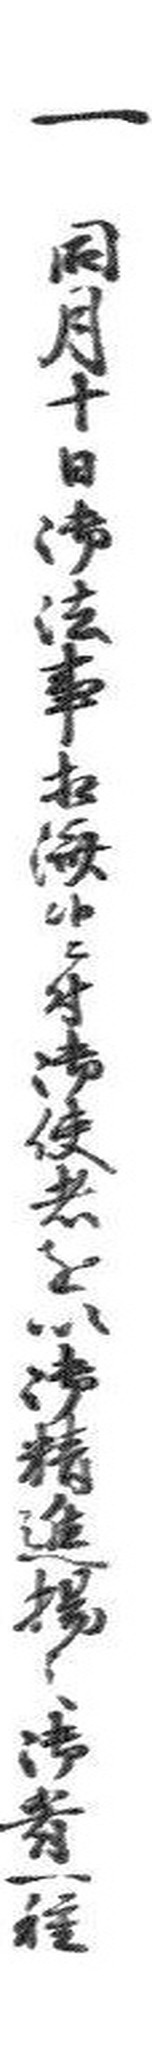一同月十日御法事相済候ニ付御使者を以御精進揚之御肴一種
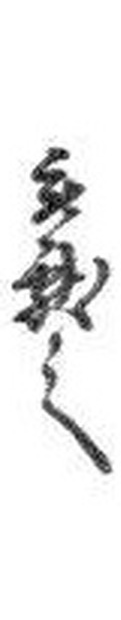被献之
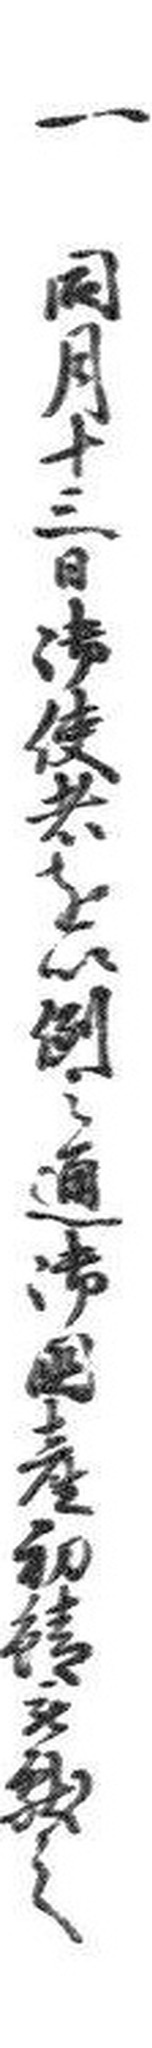一同月十三日御使者を以例之通御国産初鯖被献之
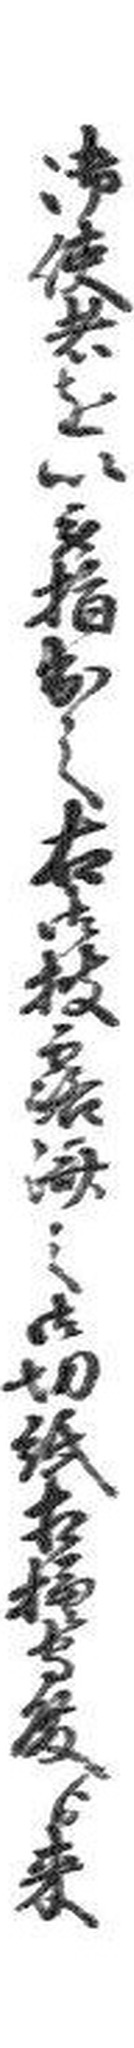御使者を以被指出之右御披露済之御切紙相模守殿ゟ来
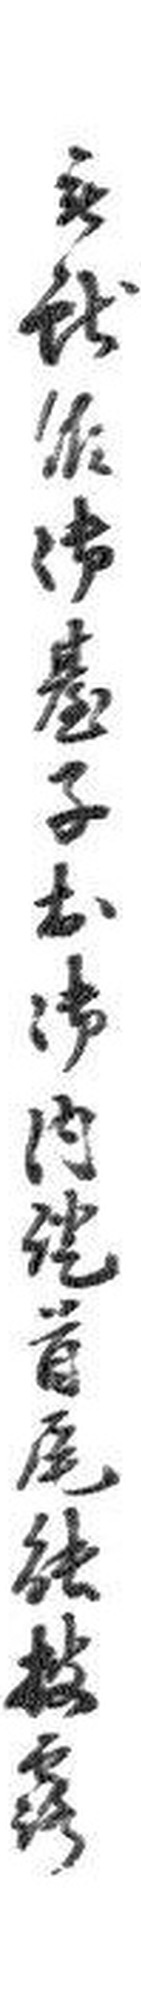被献候御台子於御内証首尾能披露
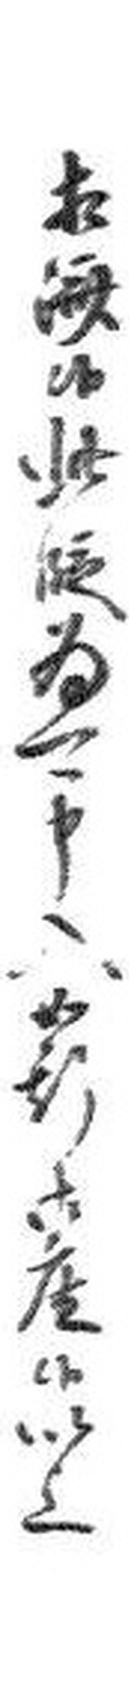相済候此段為可申入如斯御座候以上
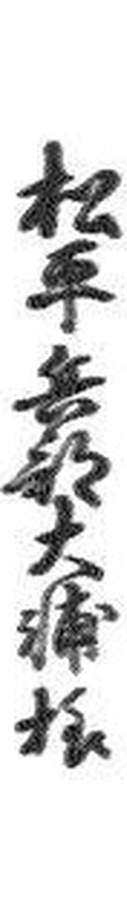松平兵部大輔様

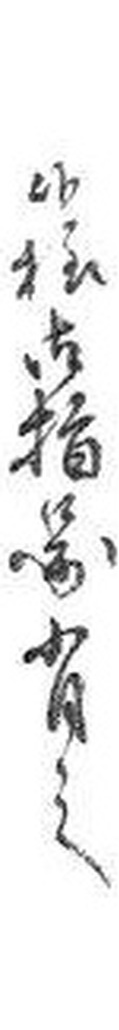候様御指図有之
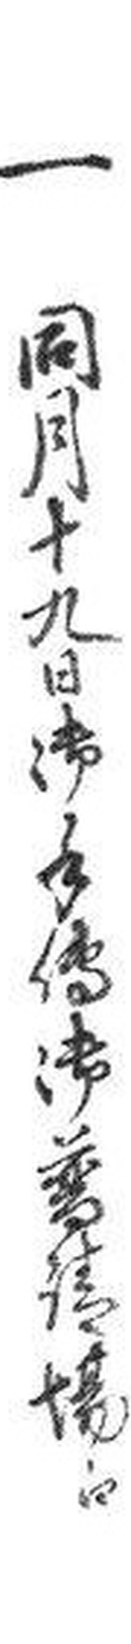一同月十九日御手伝御普請場江
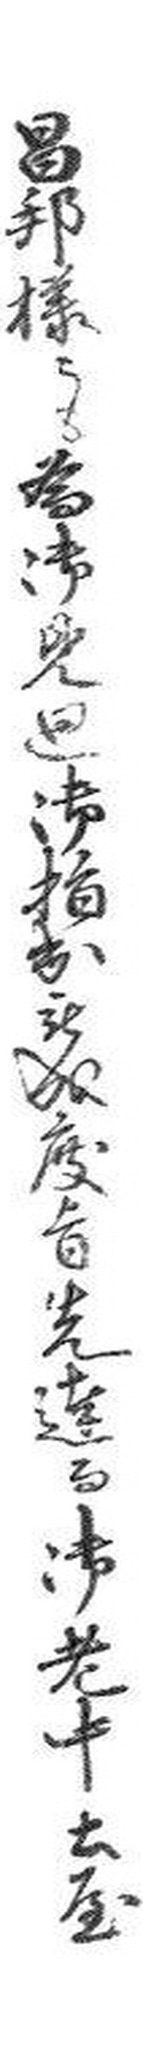昌邦様ニも為御見廻御指出被成度旨先達而御老中土屋
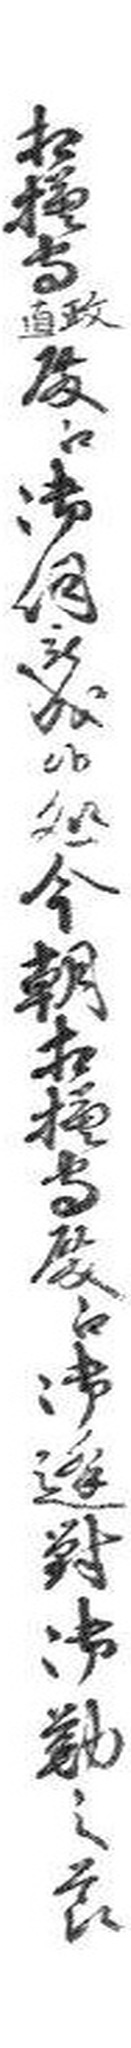直殿江御伺被成候処今朝相模守殿江御逢対御勤之節
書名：家譜 二十三 吉品公 従宝永元年到同二年
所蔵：福井県文書館 Fukui Prefectural Archives
